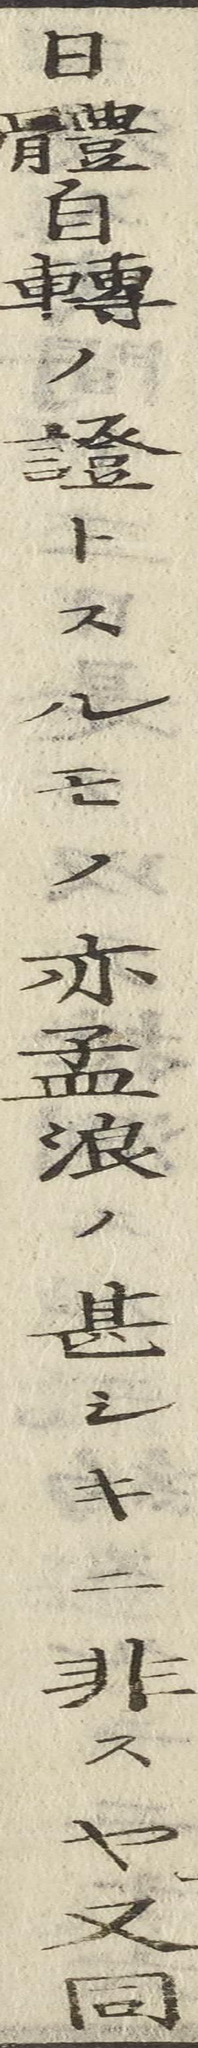日体自転ノ証トスルモノ亦孟浪ノ甚シキニ非スヤ。又同
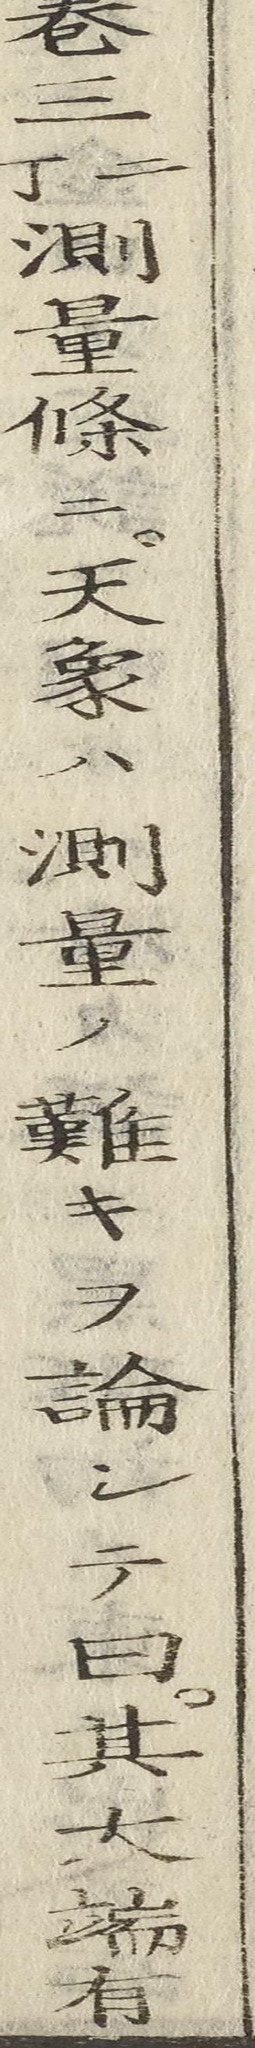巻三ニ丁測量条ニ。天象ハ測量ノ難キヲ論シテ曰。其大端有
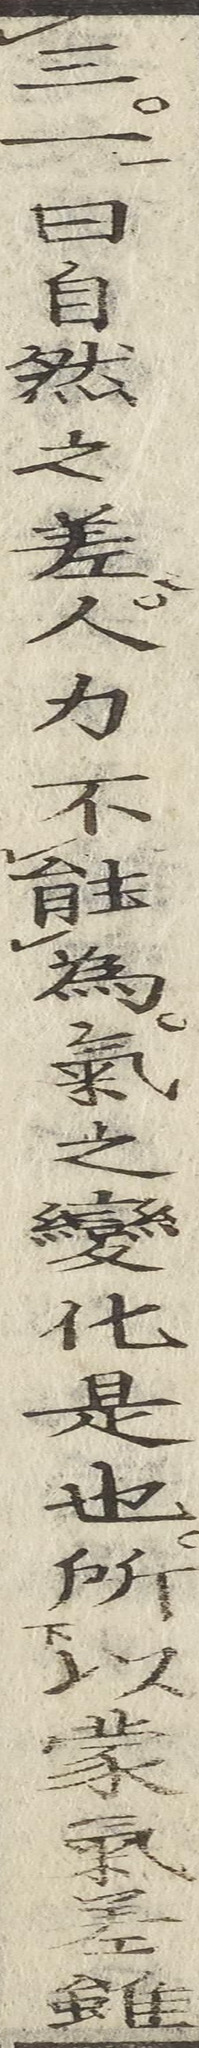三。一曰自然之差也。人力不能為。気之変化是也。所以蒙気差雖
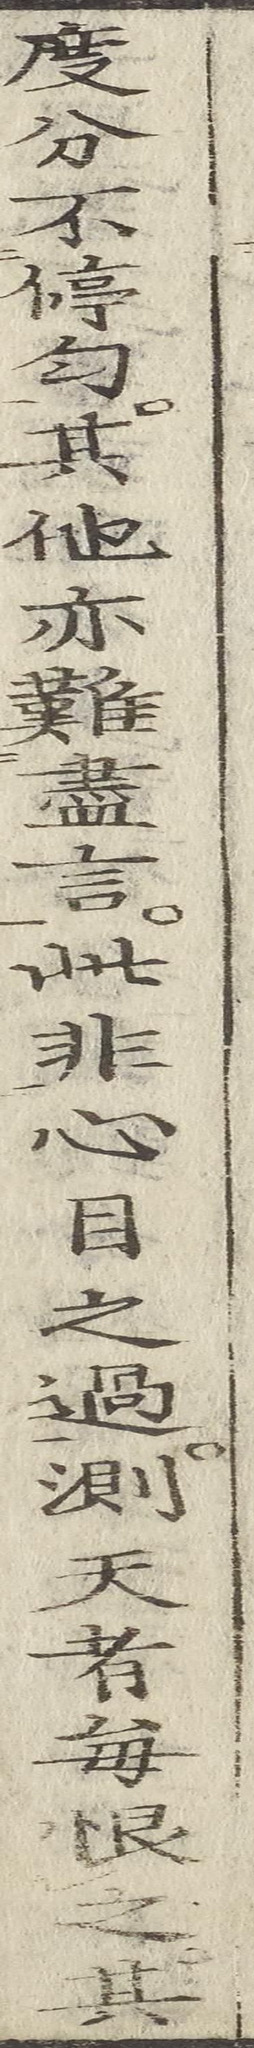度分不ニ停匀。其他亦難ニ尽言。此非ニ心目之過。測天者毎恨之。其

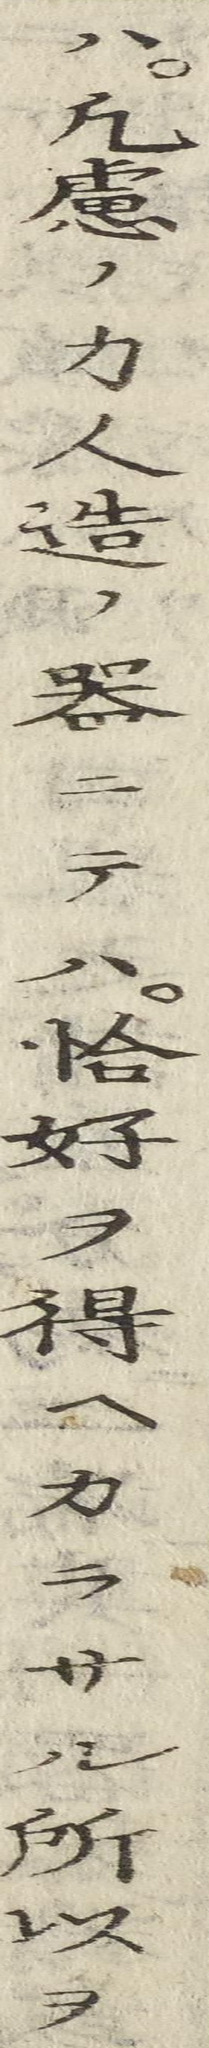ハ。凡慮ノ力人造ノ器ニテハ。恰好ヲ得ヘカラサル所以ヲ
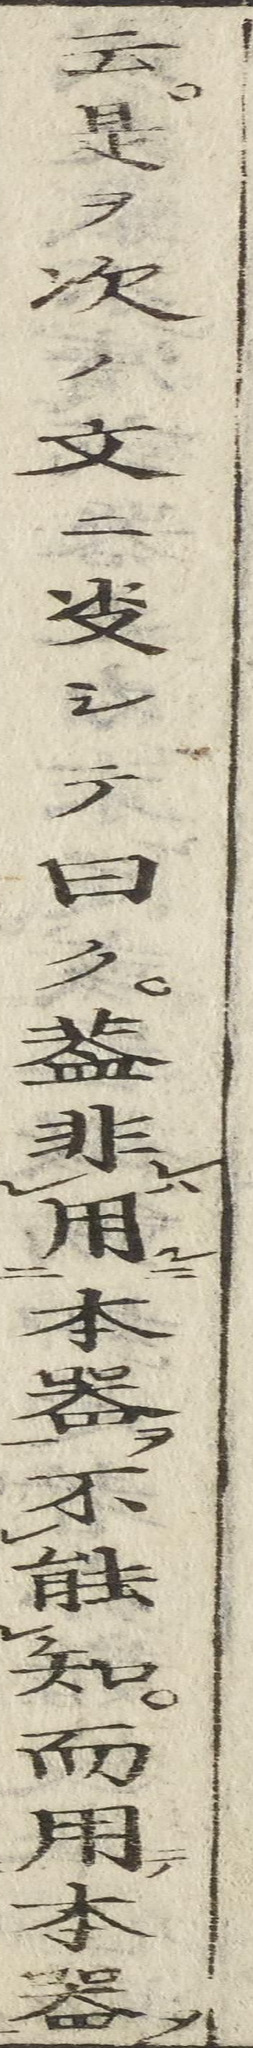云。是ヲ次ノ文ニ決シテ曰ク。葢非用ニ本器不能知。而用ニ本器
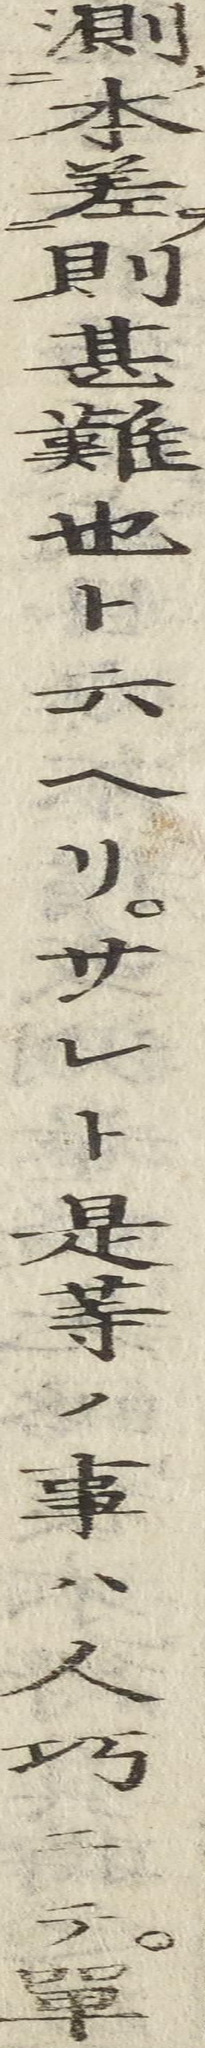測ニ本差則甚難也ト云ヘリ。サレト是等ノ事ハ人巧ニテ。単
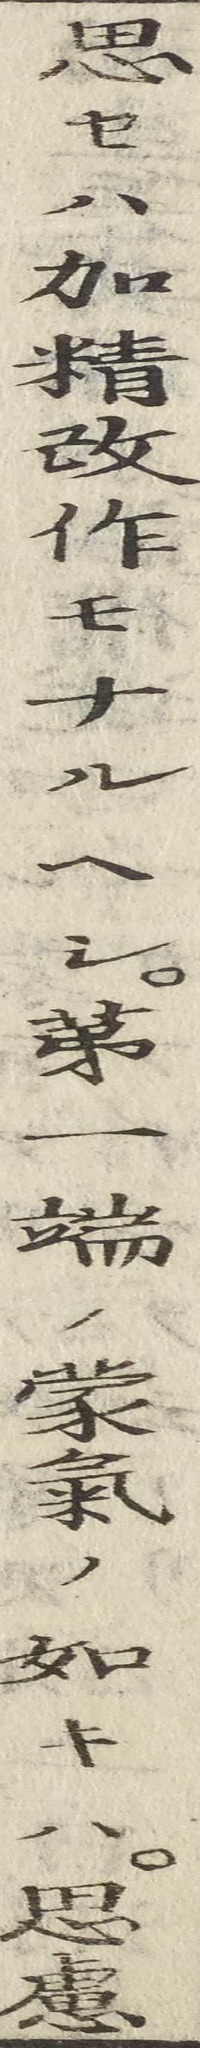思セハ加精改作モナルヘシ。第一端ノ蒙気ノ如キハ。思慮
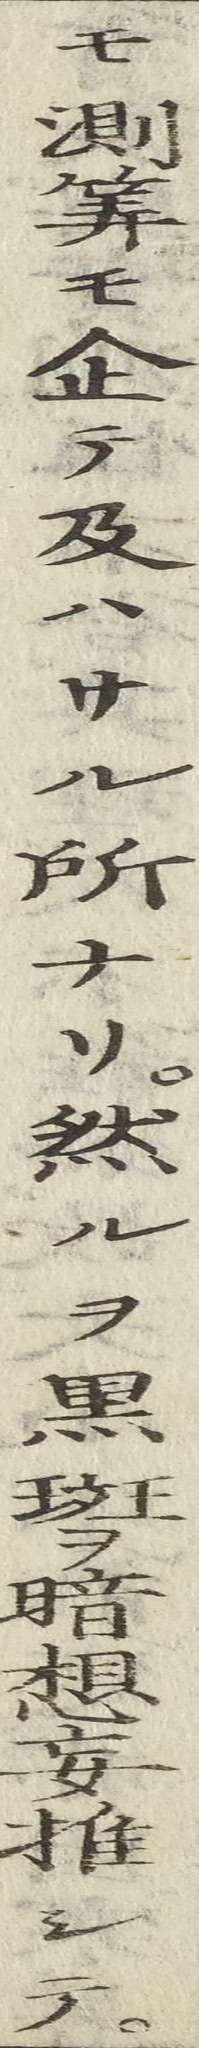モ測筭モ企テ及ハサル所ナリ。然ルヲ黒斑ヲ暗想妄推シテ。
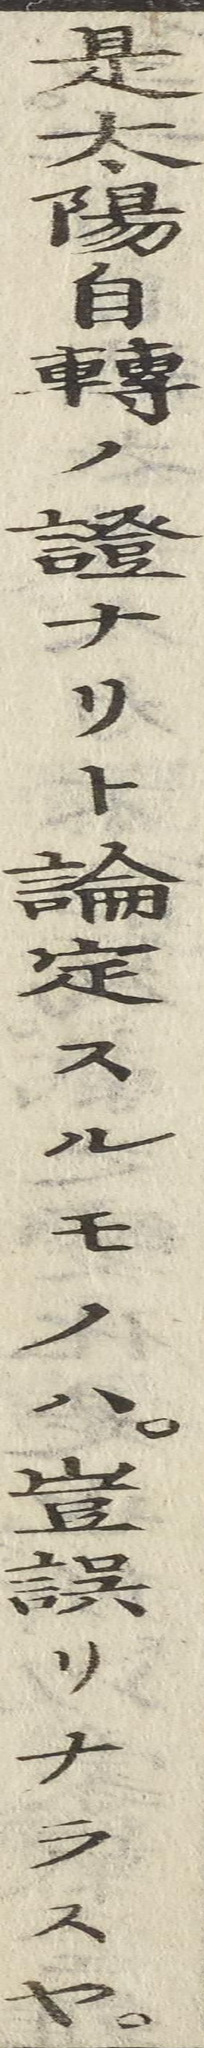是太陽自転ノ証ナリト論定スルモノハ。豈誤リナラスヤ。
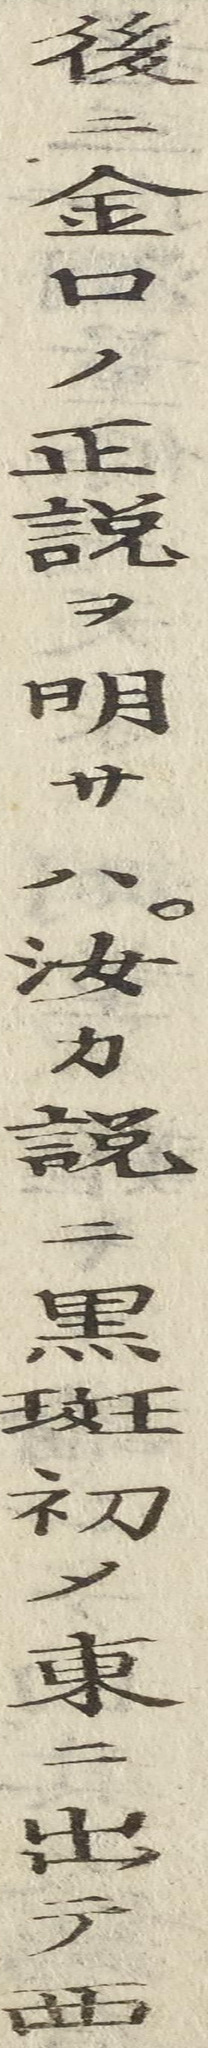後ニ金口ノ正説ヲ明サハ。汝カ説ニ黒斑初メ東ニ出テ西
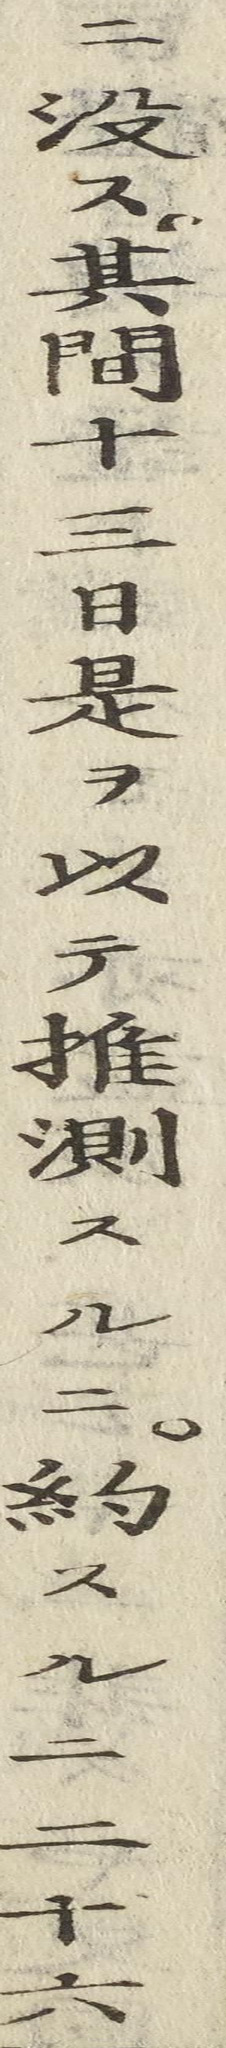ニ没ス。其間十三日是ヲ以テ推測スルニ。約スルニ二十六
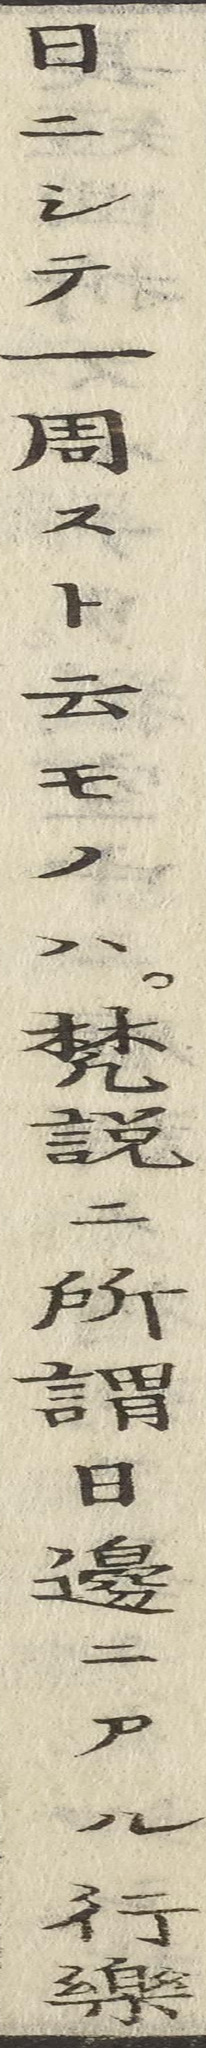日ニシテ一周スト云モノハ。梵説ニ所謂日辺ニアル行楽
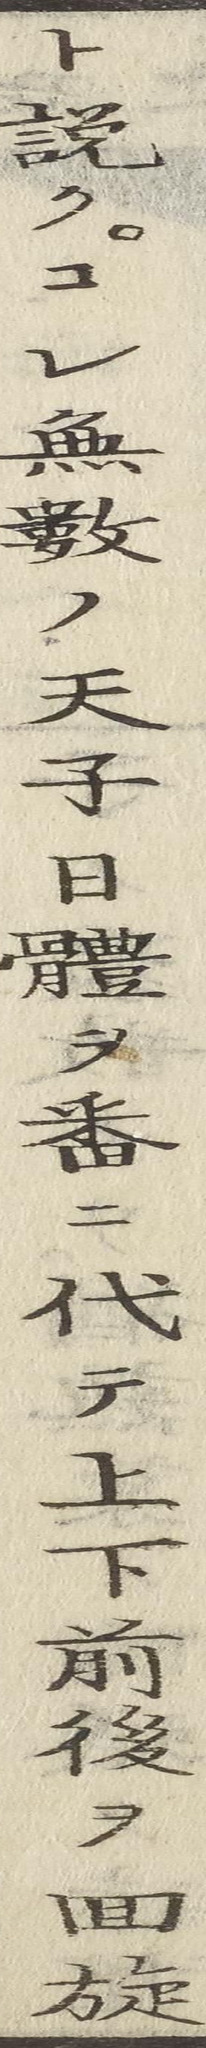ト説ク。コレ無数ノ天子日体ヲ番ニ代テ上下前後ヲ回旋
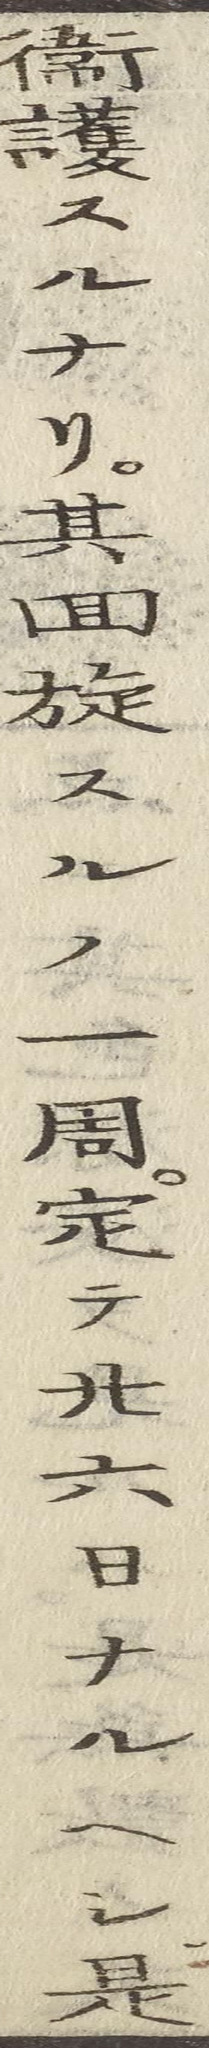衞護スルナリ。其回旋スルノ一周。定テ廿六日ナルヘシ。是
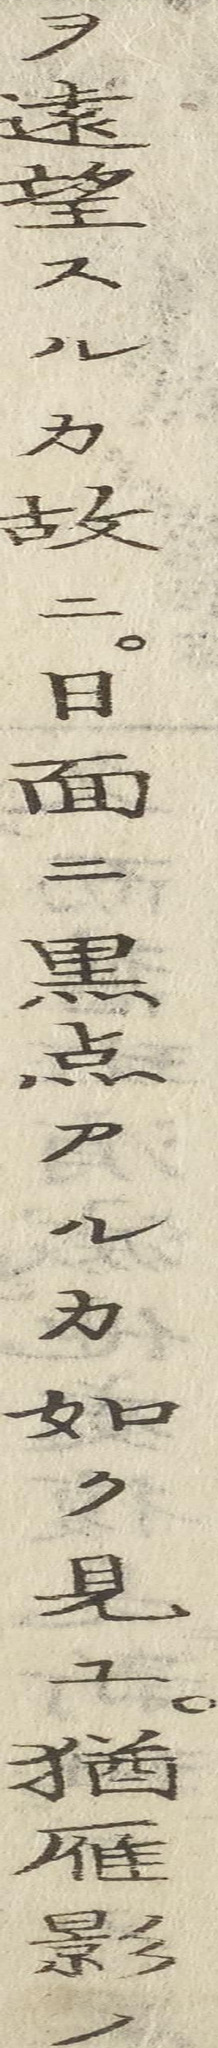ヲ遠望スルカ故ニ。日面ニ黒点アルカ如ク見ユ。猶雁影ノ
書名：護法新論　二編　中
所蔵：東京大学地震研究所図書室 Earthquake Research Institute Library, The University of Tokyo, JAPAN
